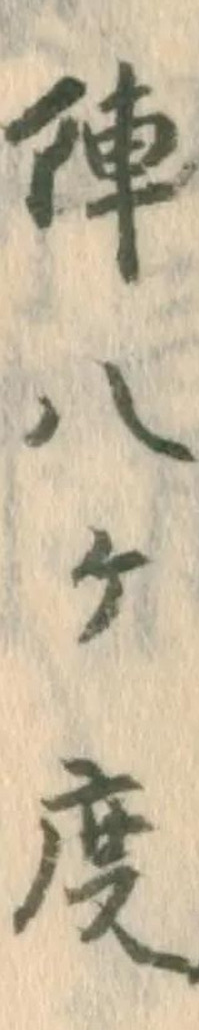陣八ケ度
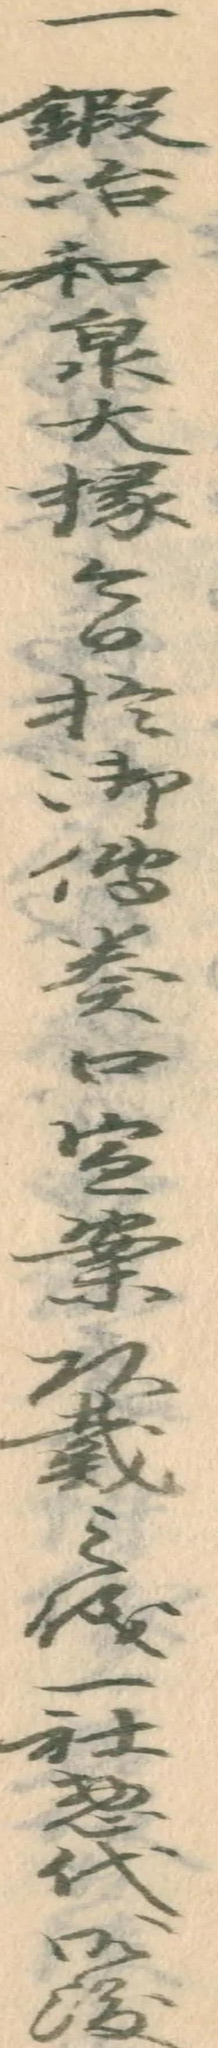一鍛冶和泉大掾今日於御伝奏口宣案頂戴之儀一社惣代へ御渡
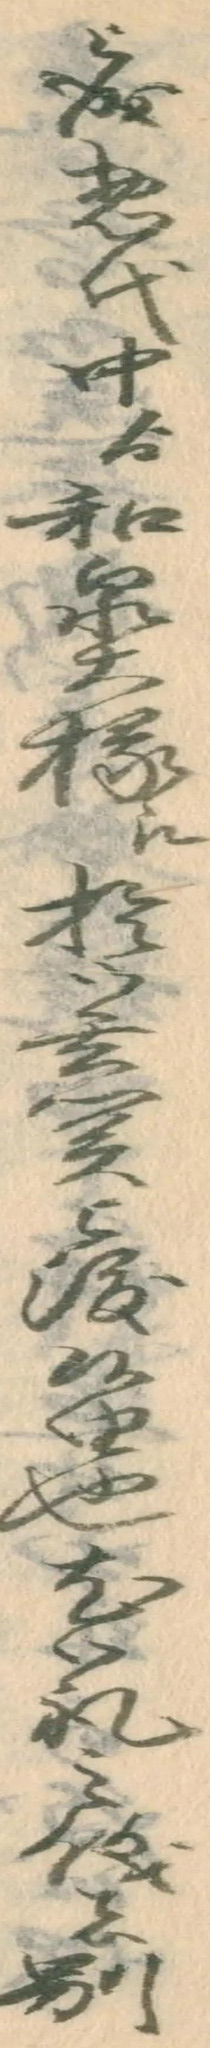被成惣代中ゟ和泉大掾江於御玄関被渡候由也尤御礼之儀者別
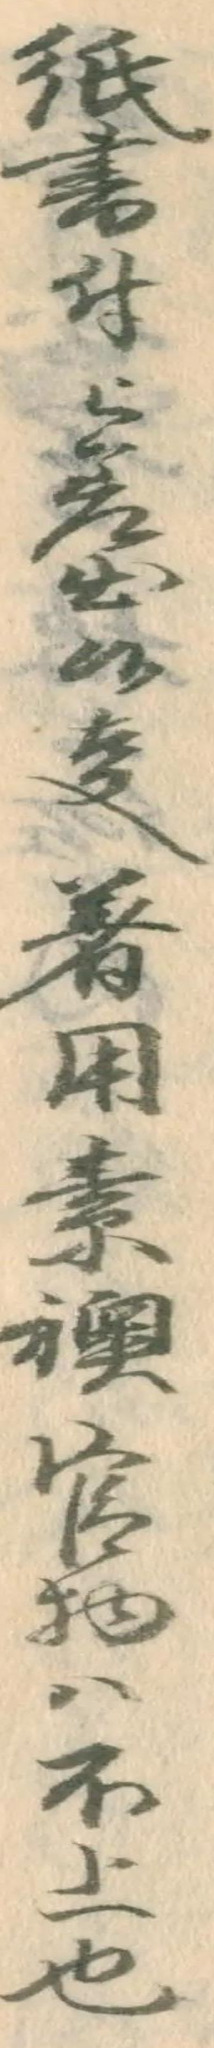紙書付被差出候事着用素襖官物ハ不上也

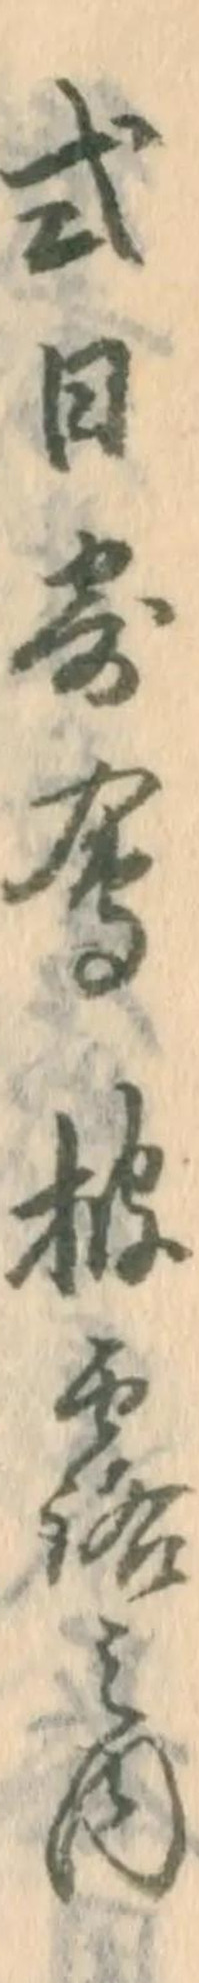式日寄会披露之内
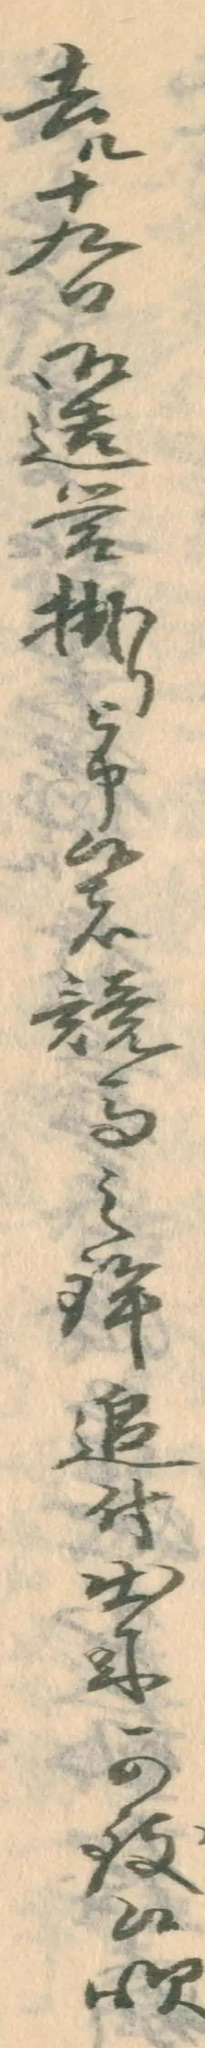一去ル十九日御造営掛り被申候は競馬之鉾追付出来可致候吹
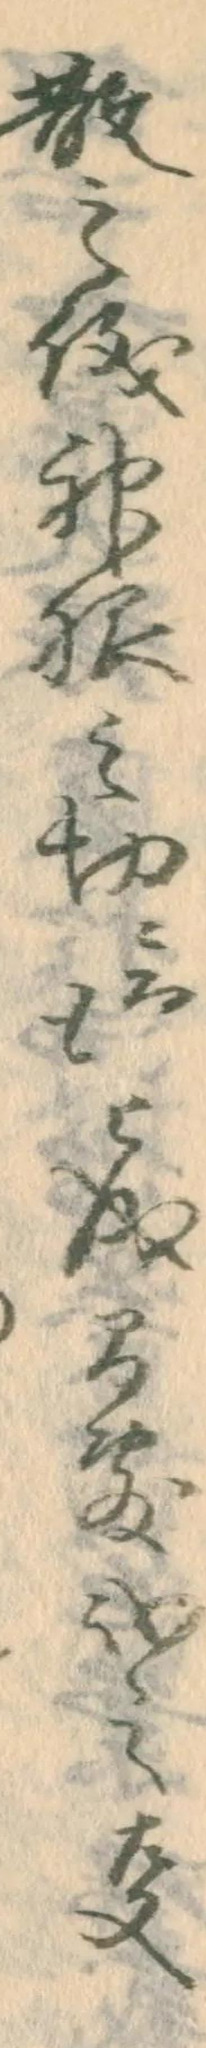散之儀神服之切ニ而も被成間敷哉之事
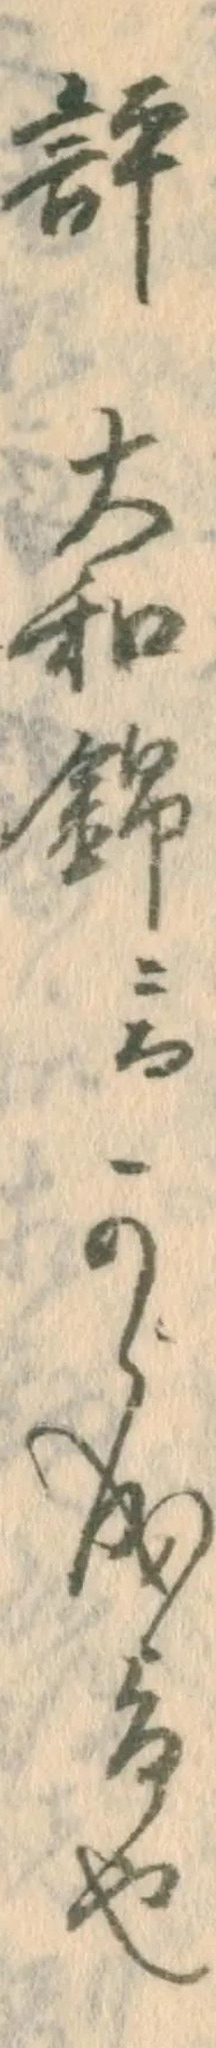評大和錦ニ而可被成旨也
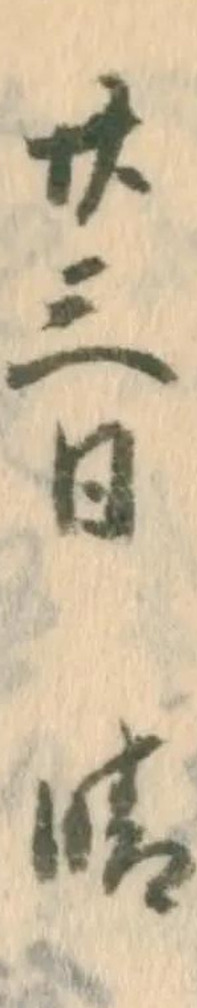廿三日晴
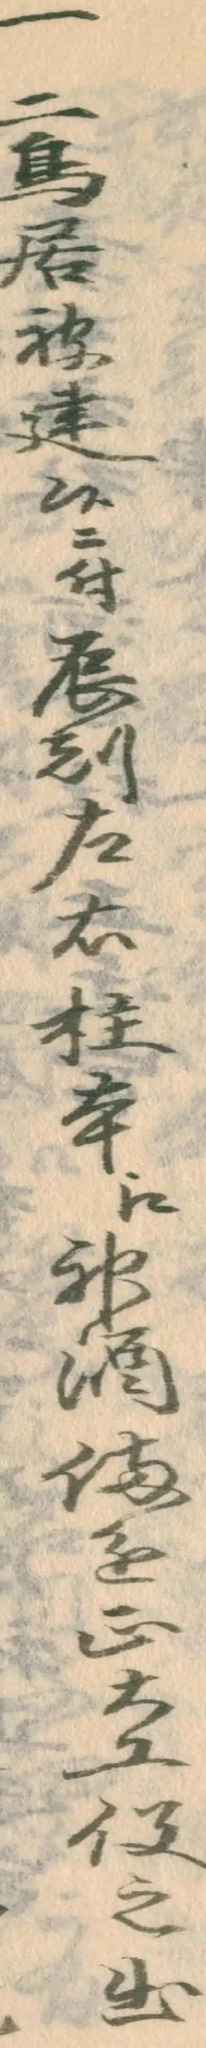一二鳥居被建候ニ付辰刻左右柱本江神酒備進正大工役之出
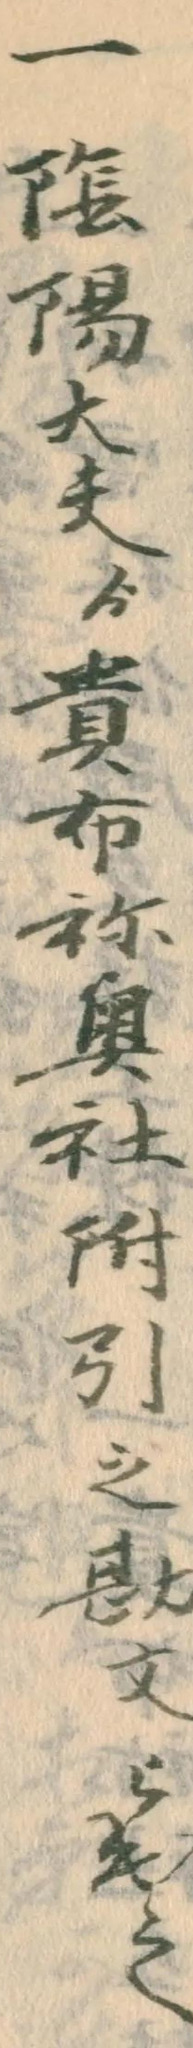一陰陽大夫ゟ貴布祢奥社附引之勘文被出之
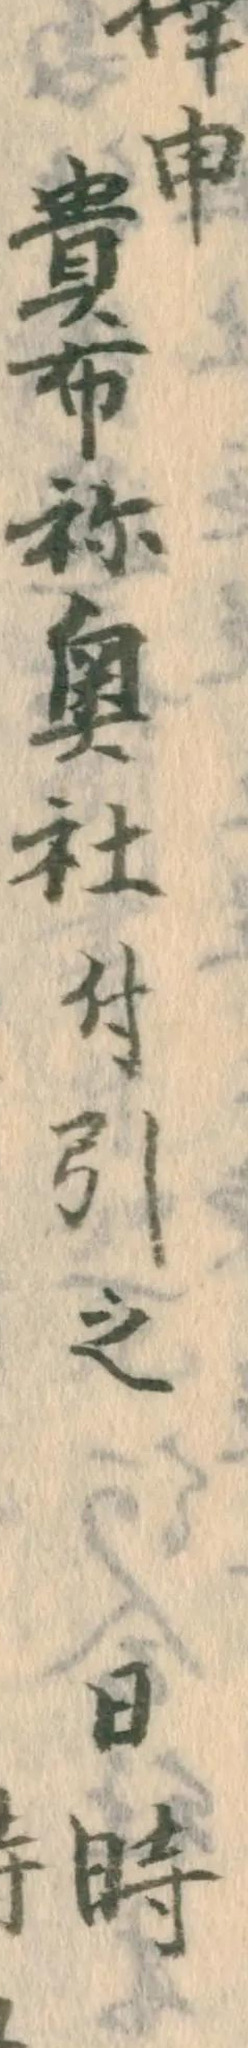貴布祢奥社付引之日時
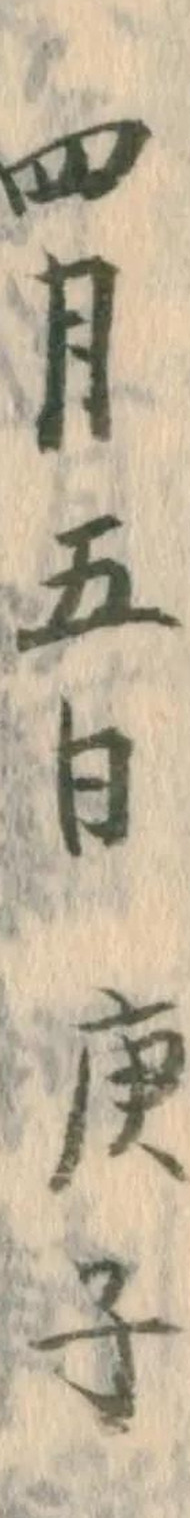四月五日庚子時丑
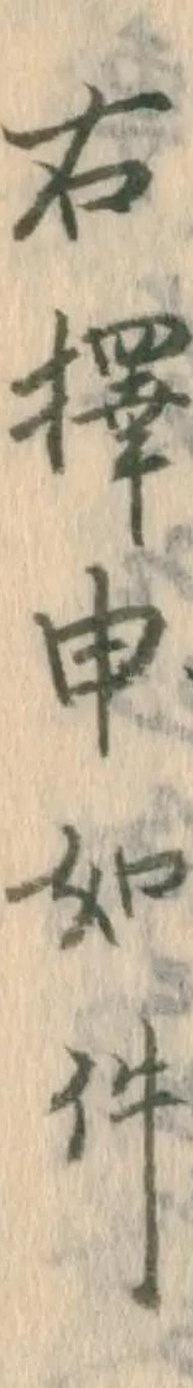右択申如件
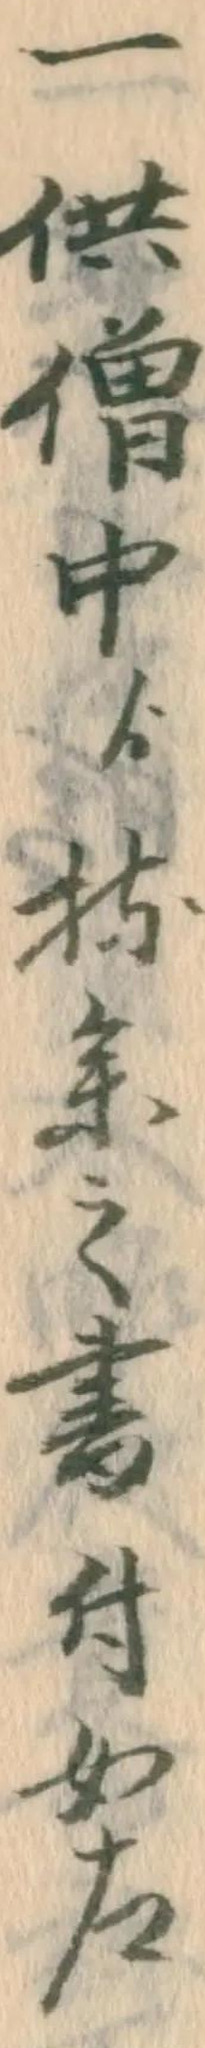一供僧中ゟ持参之書付如左
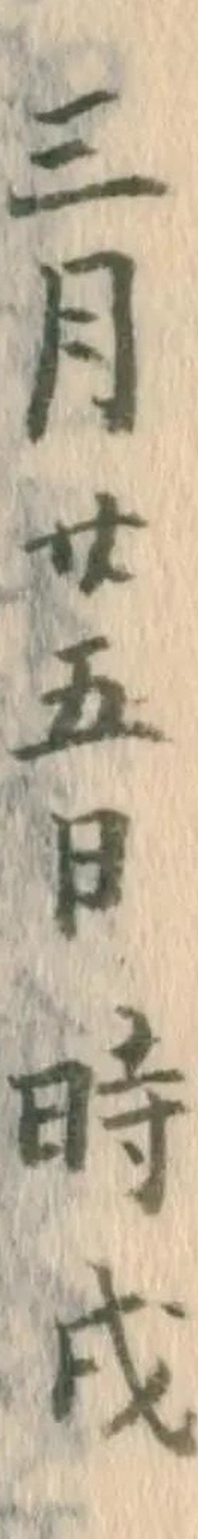三月廿五日時戌
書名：賀茂社記録. 第17冊
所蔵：国立国会図書館 National Diet Library, JAPAN
